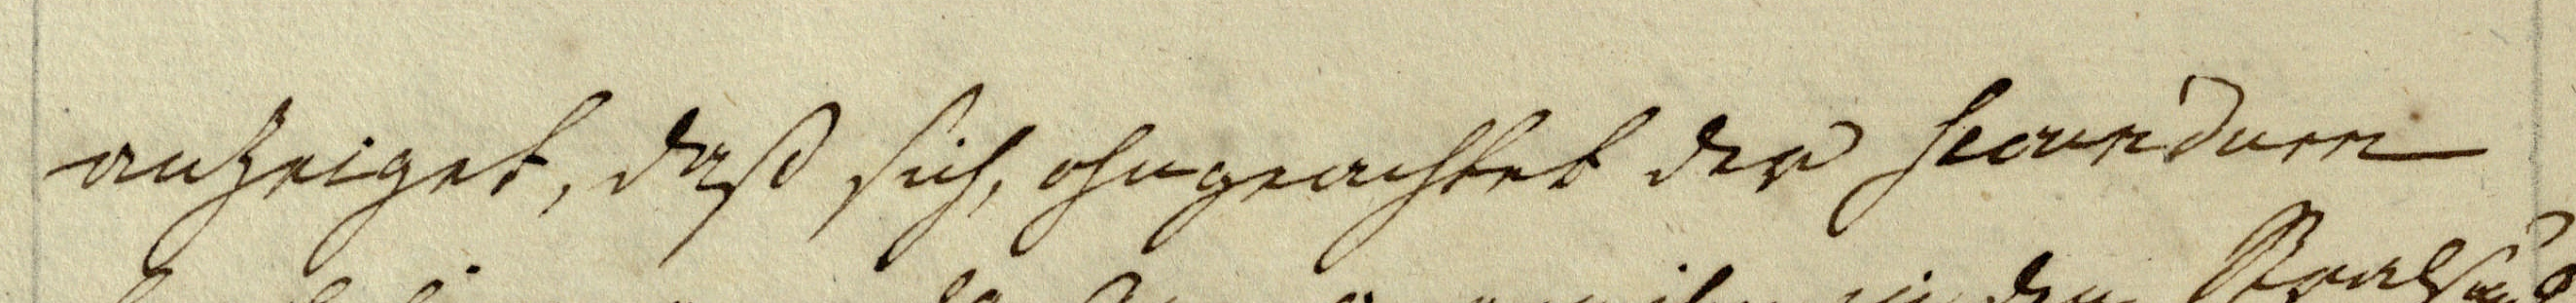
anzeiget, daß sich, ohngeachtet der secundum
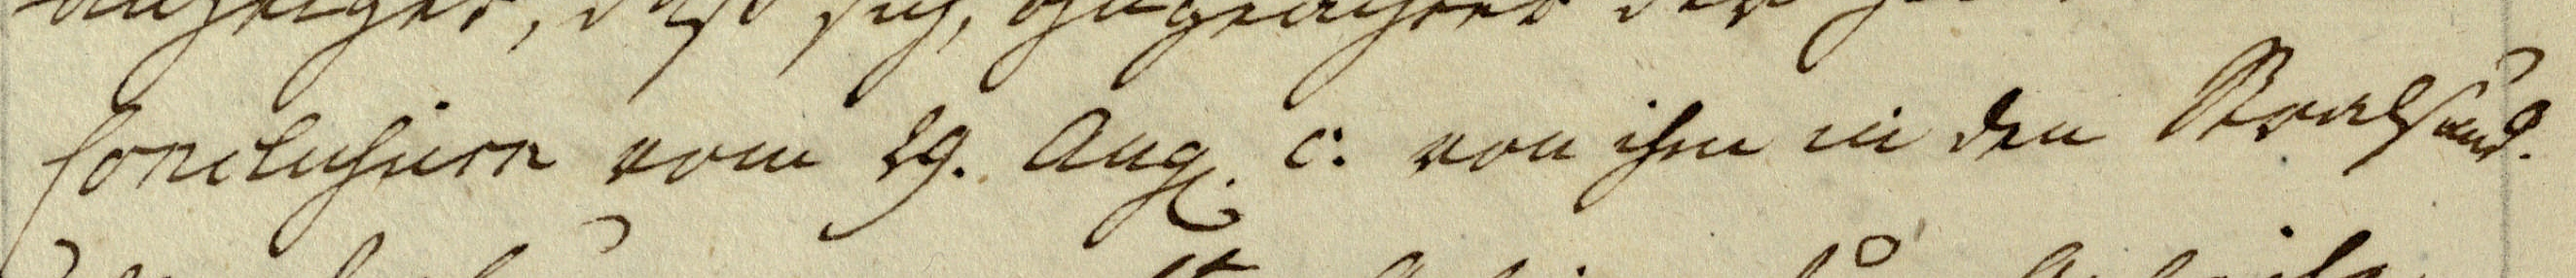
Conclusum vom 29. Aug. c. von ihm in den Stralsund¬
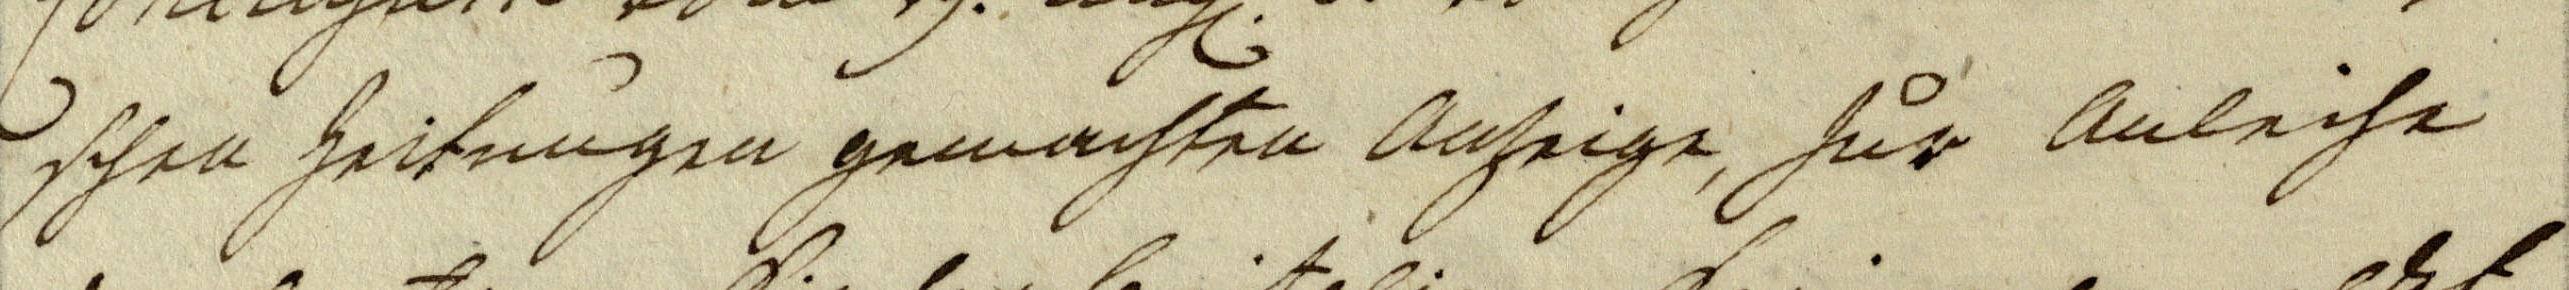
schen Zeitungen gemachten Anzeige, zur Anleihe
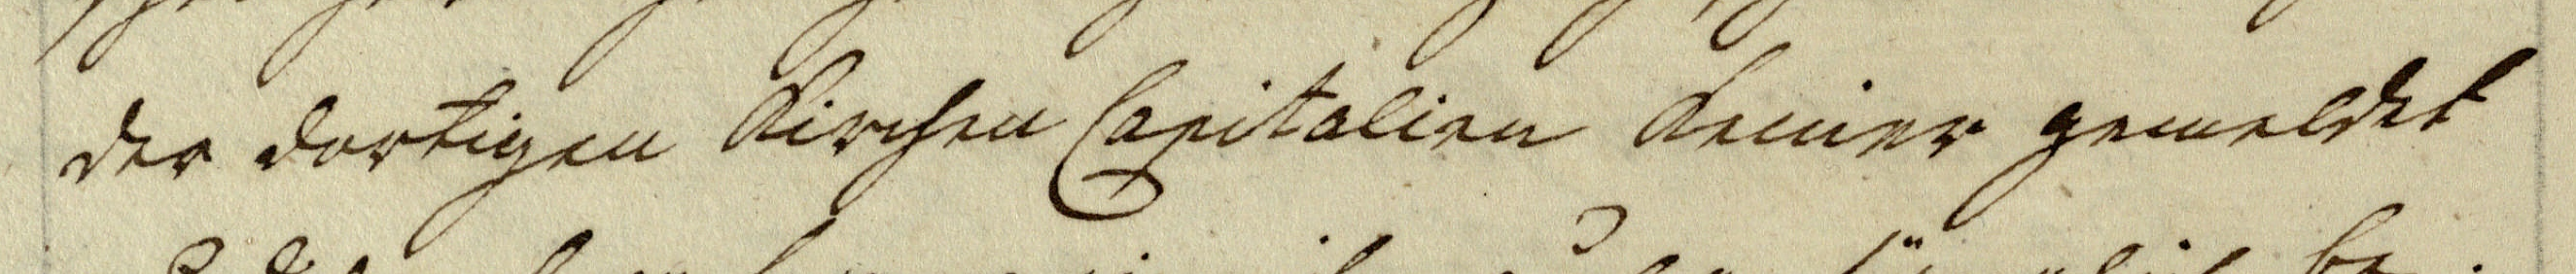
der dortigen Kirchen Capitalien keiner gemeldet
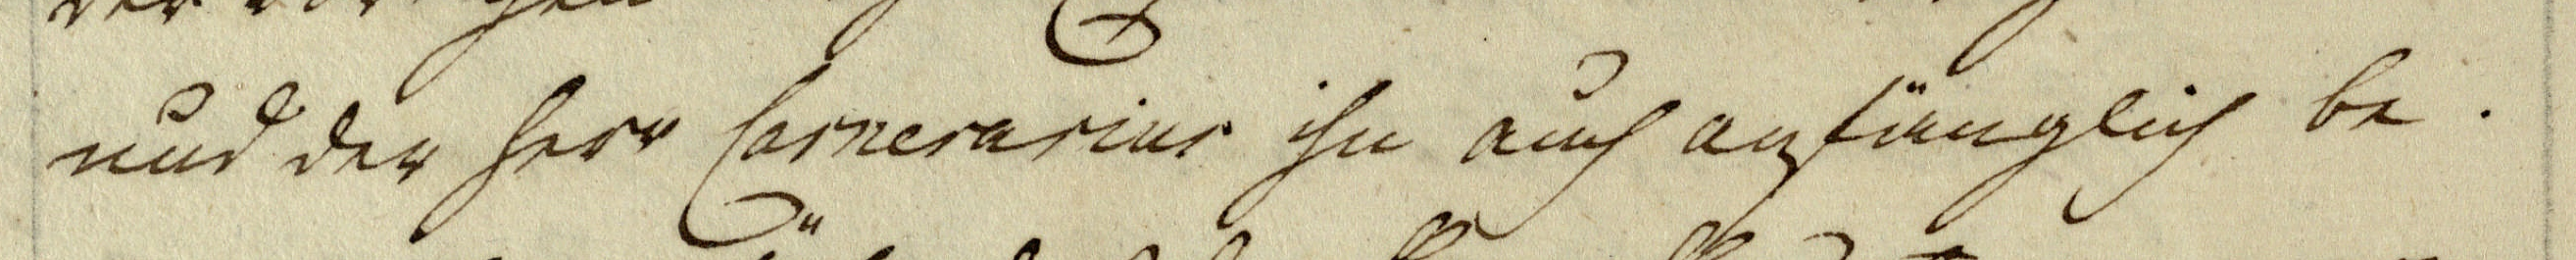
und der Herr Camerarius ihn auch anfänglich be¬
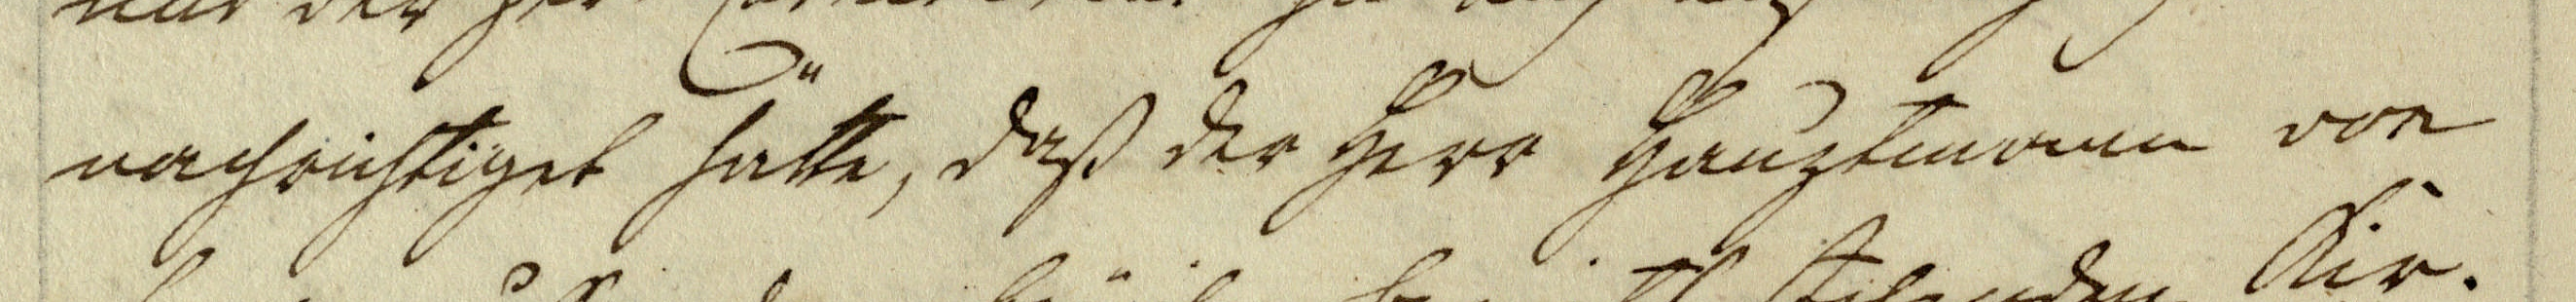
nachrichtiget hätte, daß der Herr Hauptmann von
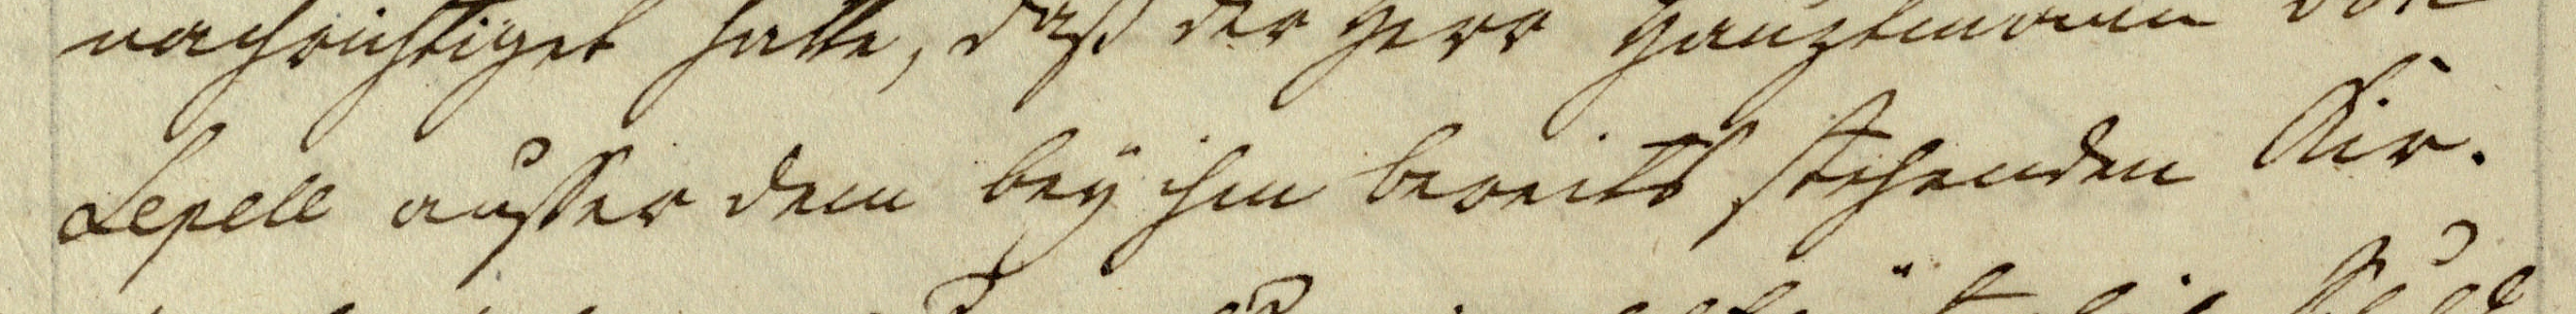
Lepell ausser dem beÿ ihm bereits stehenden Kir¬
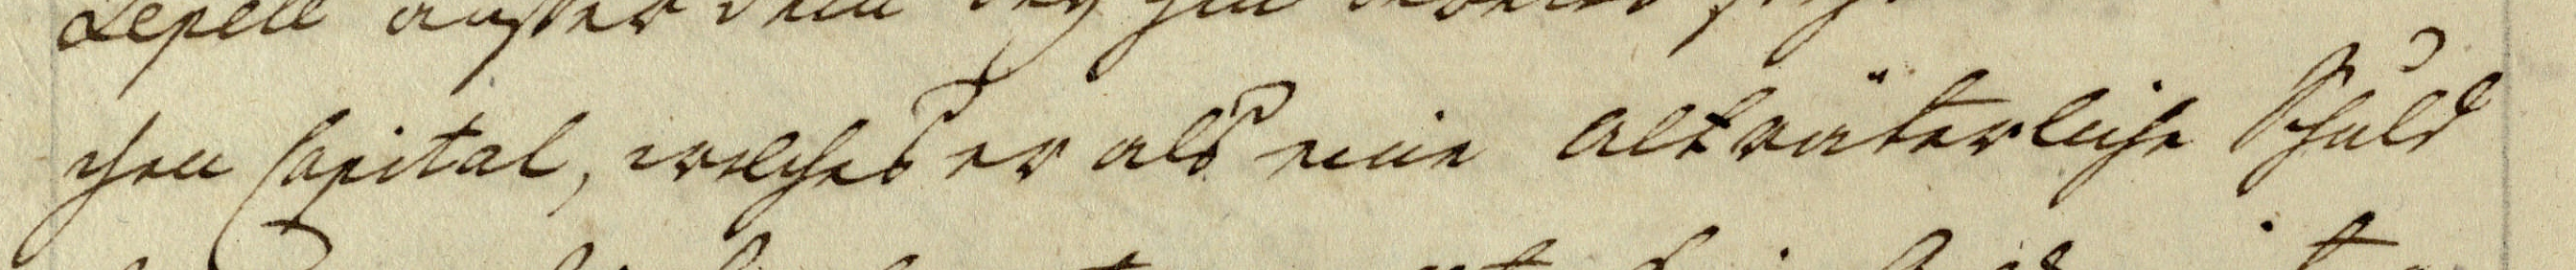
chen Capital, welches er als eine altväterliche Schuld
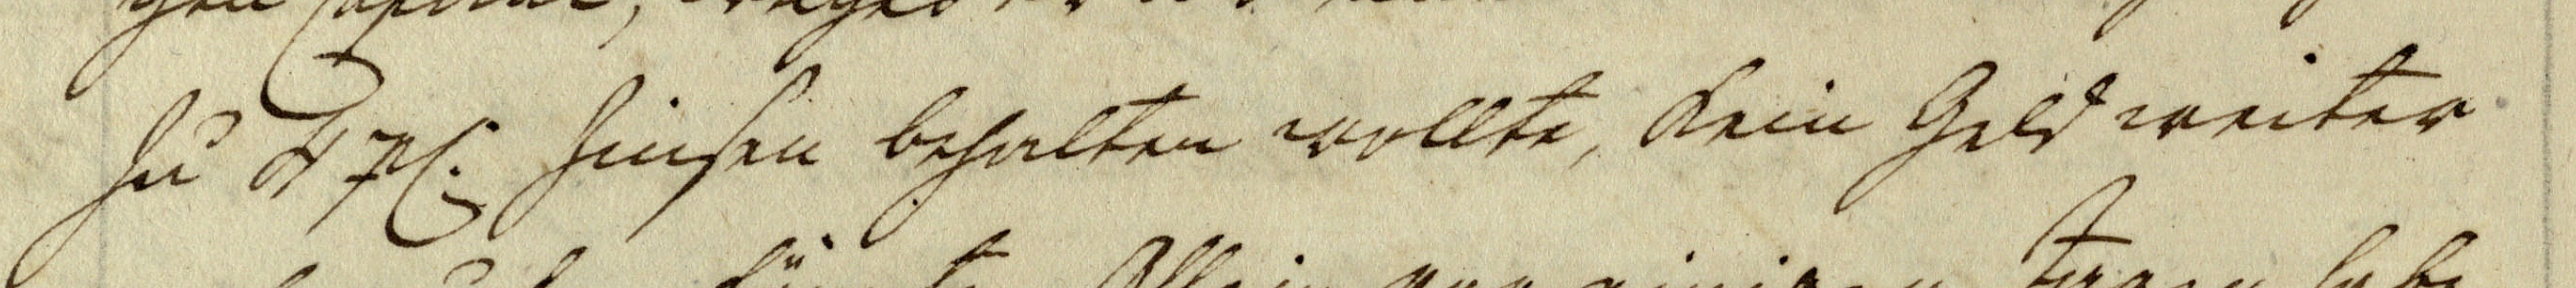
zu 4 pl. Zinsen behalten wollte, kein Geld weiter
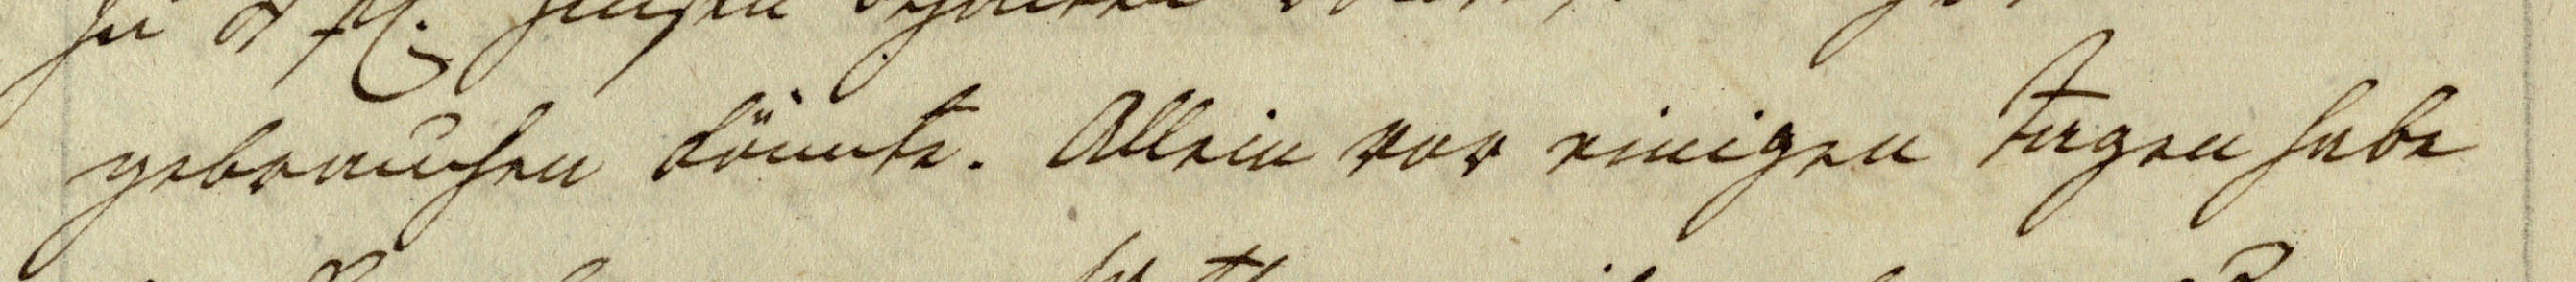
gebrauchen könnte. Allein vor einigen Tagen habe
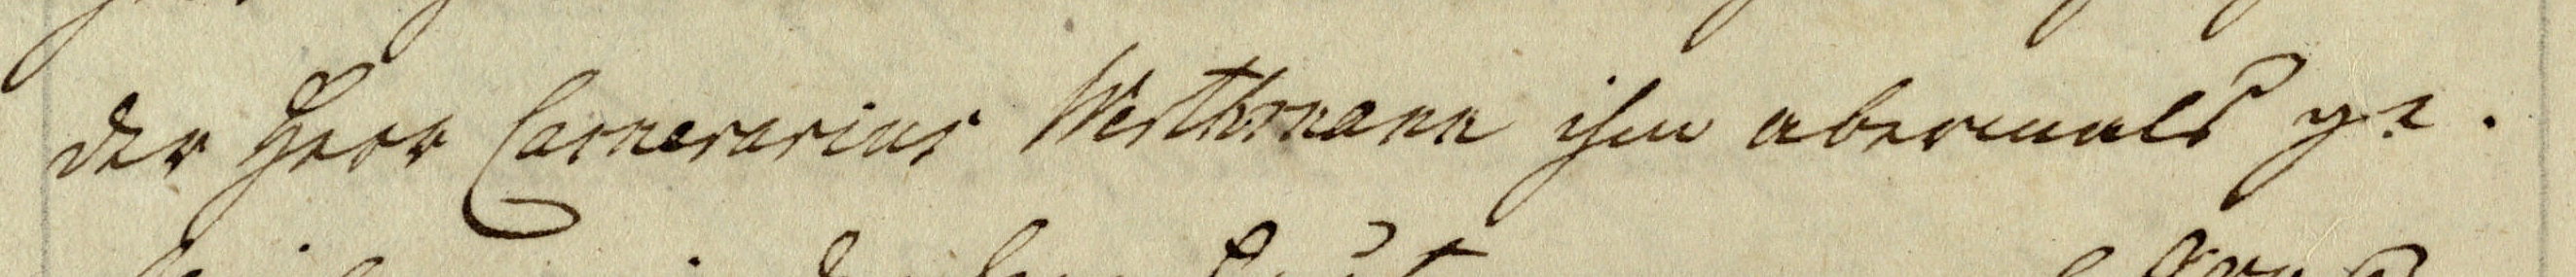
der Herr Camerarius Werthmann ihm abermals ge¬
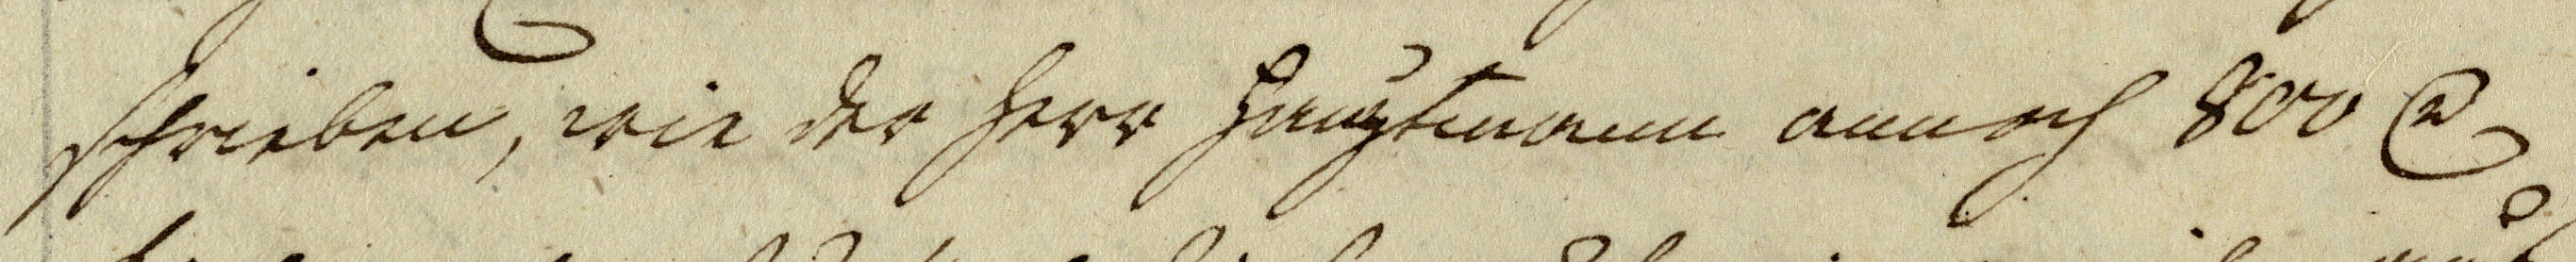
schrieben, wie der Herr Hauptmann annoch 800 l.
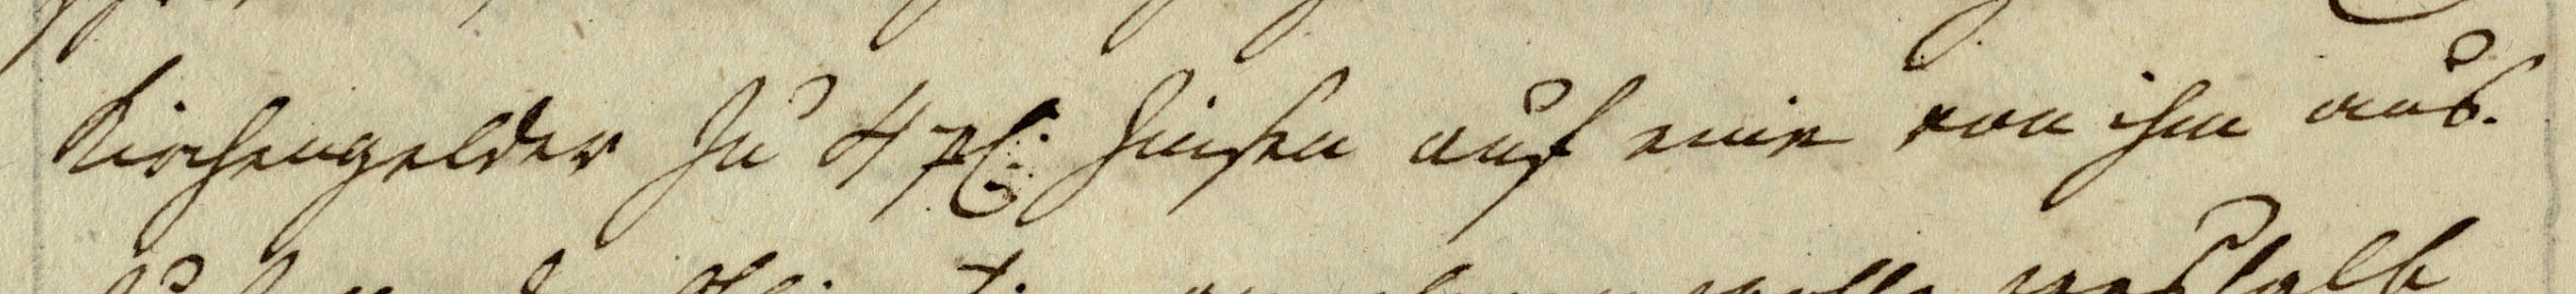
Kirchengelder zu 4 pl. Zinsen auf eine von ihm aus¬
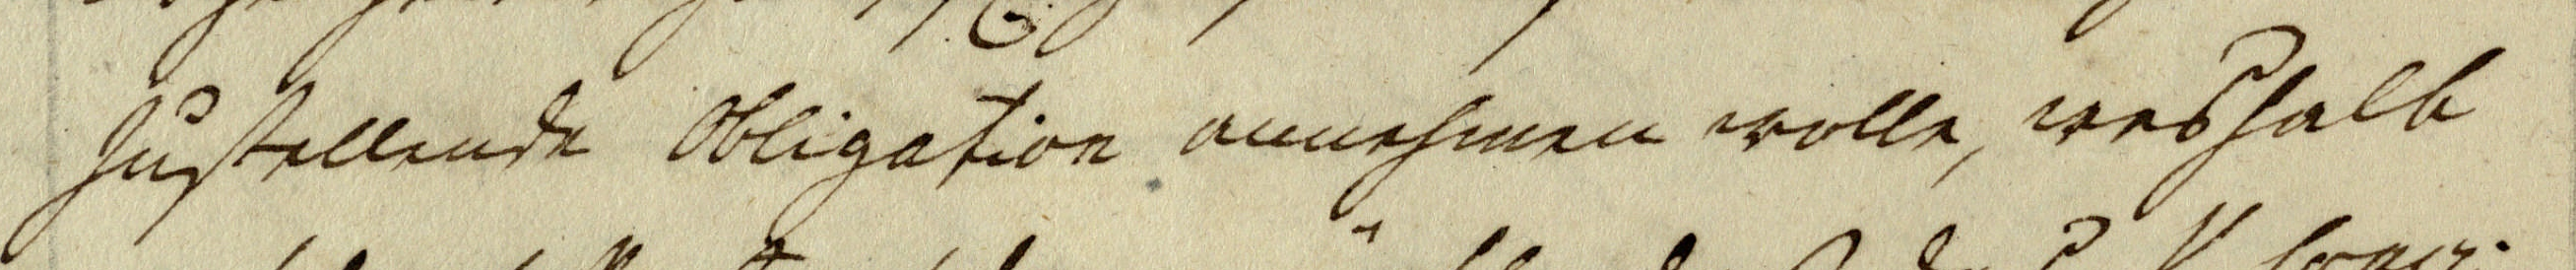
zustellende Obligation annehmen wolle, weshalb
